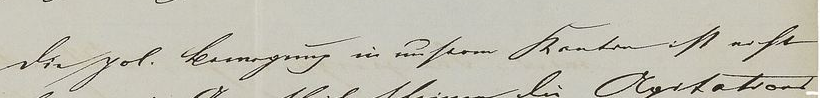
Die pol. Bewegung in unserm Kanton ist nicht
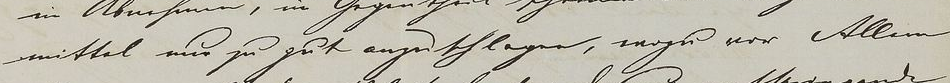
mittel nur zu gut anzuschlagen, wozu vor Allem
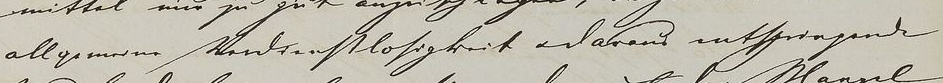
allgemeine Verdienstlosigkeit & daraus entspringende
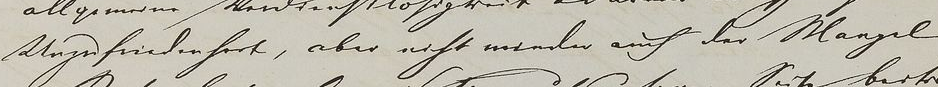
Unzufriedenheit, aber nicht minder auch der Mangel
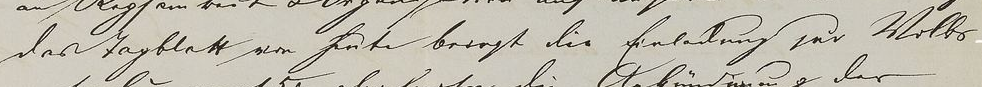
Das Tagblatt von heute bringt die Einladung zur Volks-
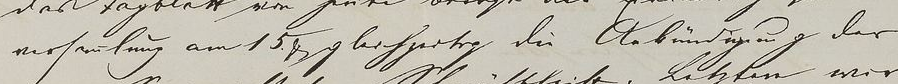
versammlung am 15. & gleichzeitig die Ankündigung der
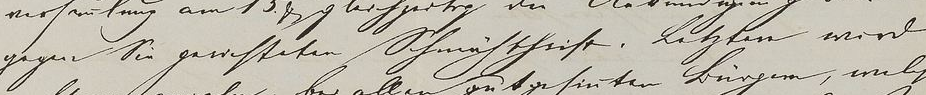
gegen Sie gerichteten Schmähschrift. Letztere wird
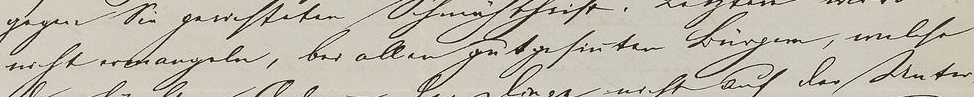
nicht ermangeln, bei allen gutgesinnten Bürgern, welche
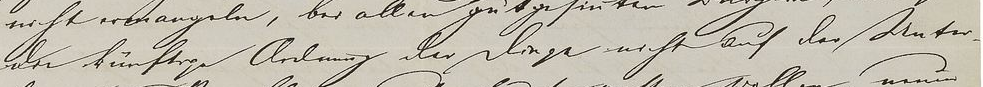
die künftige Ordnung der Dinge nicht auf der Unter-
